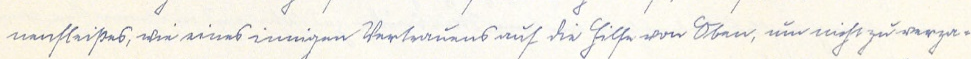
nenfleißes, wie eines innigen Vertrauens auf die Hilfe von Oben, um nicht zu verza-
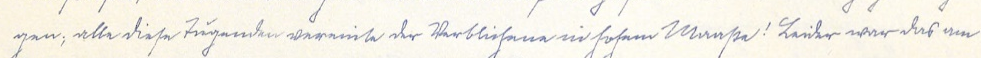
gen; alle diese Tugenden vereinte der Verblichenen in solchem Maaß! Leider war das am
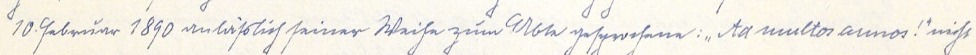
10. Februar 1890 anlässlich seiner Weihe zum Abte gesprochene: "Ad multos annos!" nicht
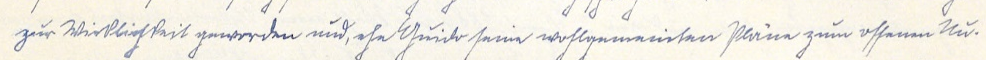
zur Wirklichkeit geworden und, ehe Guido seine wohlgemeisterten Plan zum offenen Nu-
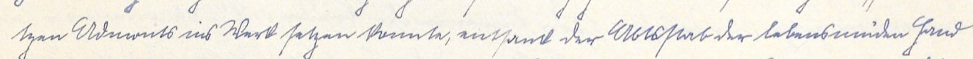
tzen Admonts ins Werk setzen konnte, entsank der Abtsstab der lebensmüden Hand
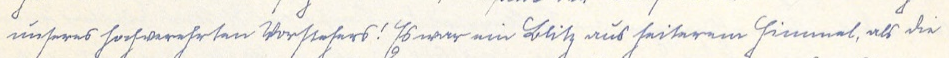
unseres hochverehrten Vorstehers! Es war ein Blitz aus heiterem Himmel, als die
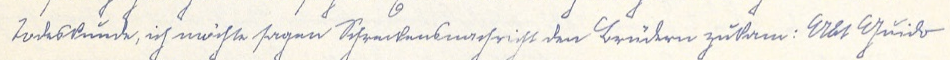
Todeskunde, ich möchte sagen Schreckensnachricht den Brüdern zukam: Abt Guido
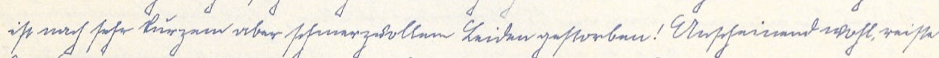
ist nach sehr kurzem aber schmerzvollem Leiden gestorben! Anscheinend wohl, reiste
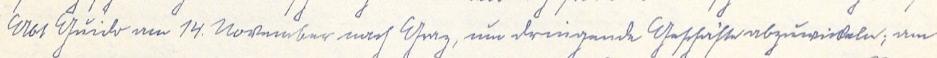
Abt Guido am 14. November nach Graz, um dringende Geschäfte abzuwickeln; am
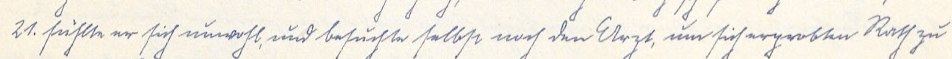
21. fühlte er sich unwohl, und besuchte selbst noch den Arzt, um sich erprobten Rath zu
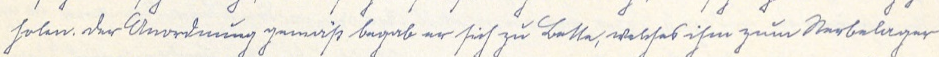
holen. Der Anordnung gemäß begab er sich Bette, welches ihm zum Sterbelager
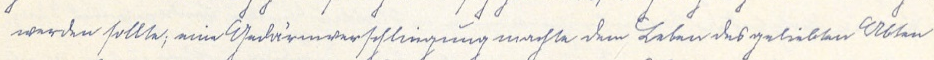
werden sollte; eine Gedärmeverschlingung machte dem Leben des geliebten Abten
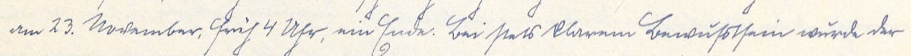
am 23. November, Früh 4 Uhr, ein Ende. Bei stets klarem Bewusstsein wurde der
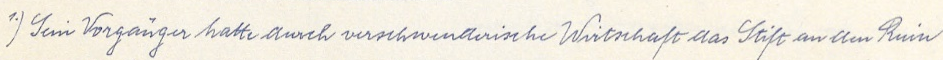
1.) Sein Vorgänger hatte durch verschwenderische Wirtschaft das Stift an den Ruin
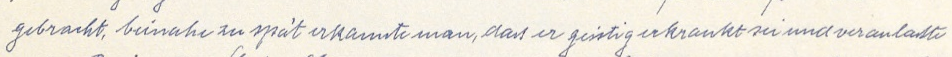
gebracht, beinahe zu spät erkannte man, dass er geistig erkrankt sei und veranlasste
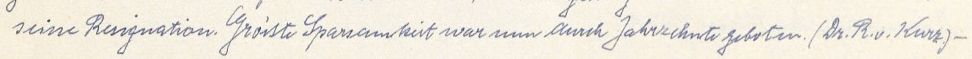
seine Resignation. Grösste Sparsamkeit war nun durch Jahrzehnte geboten. (Dr. R. v/Karz.)
